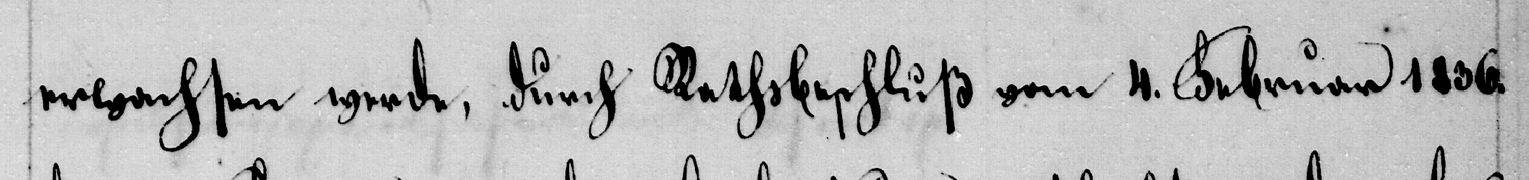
erwachsen werde, durch Rathsbeschluß vom 4. Februar 1836.
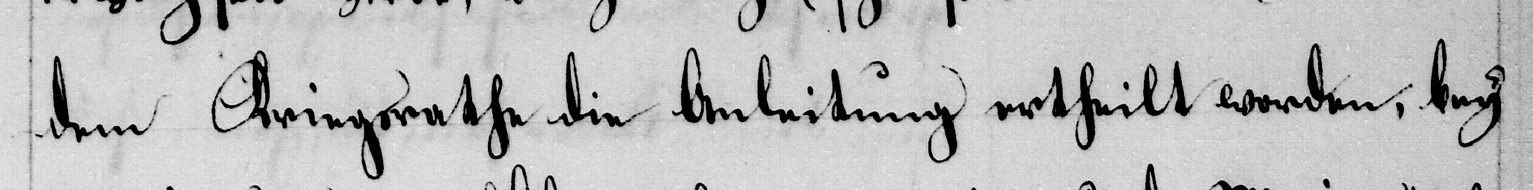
dem Kriegsrathe die Anleitung ertheilt worden, bey
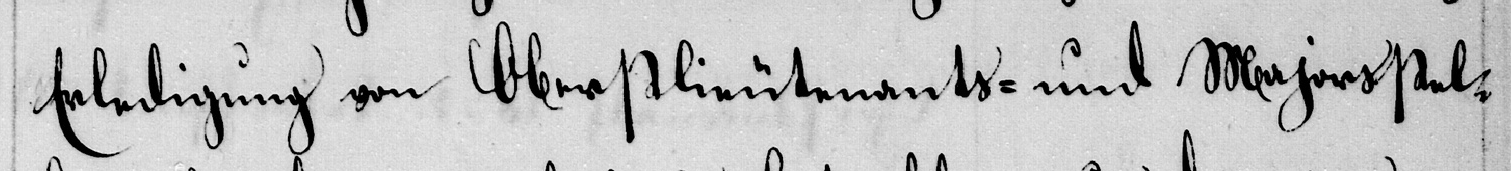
Erledigung von Oberstlieutenants- und Majorsstel¬
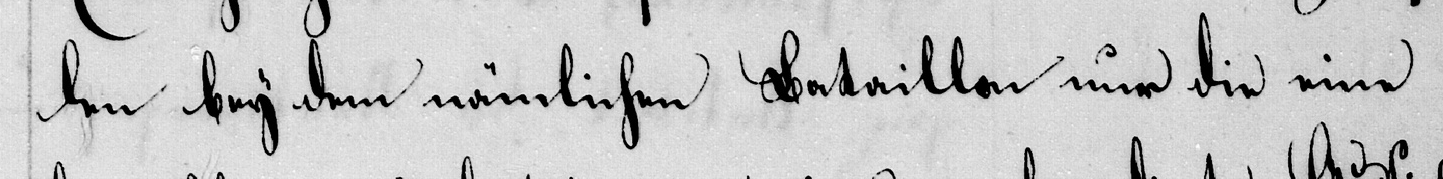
len bey dem nämlichen Bataillon nur die eine
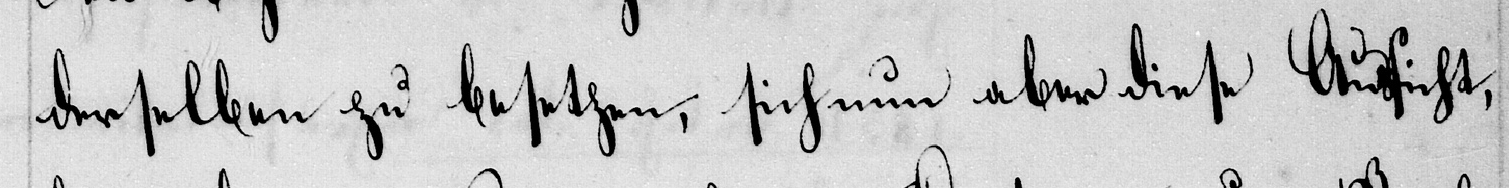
derselben zu besetzen, sich nun aber diese Aussicht,
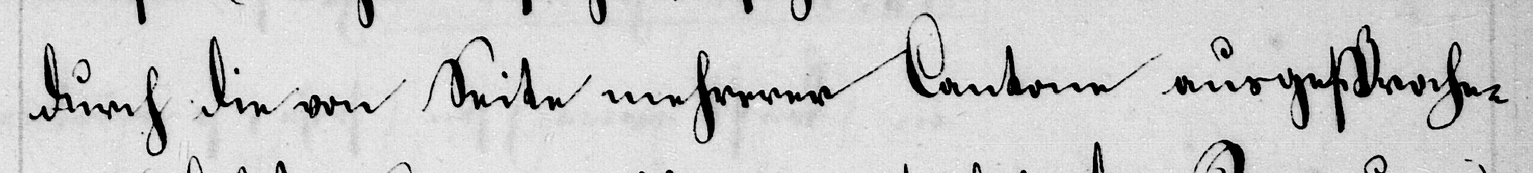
durch die von Seite mehrerer Cantone ausgesproche¬
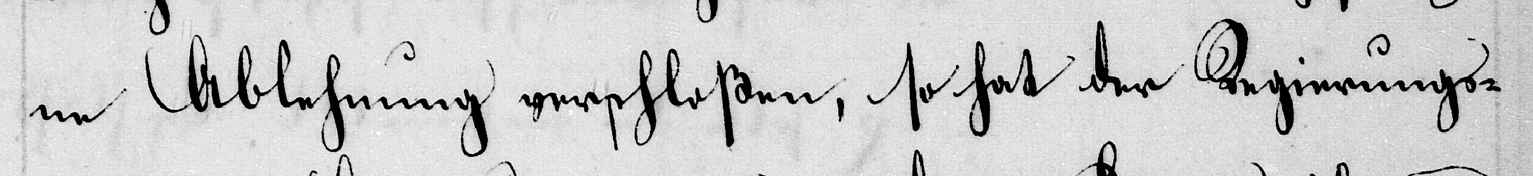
ne Ablehnung verschloßen, so hat der Regierungs¬
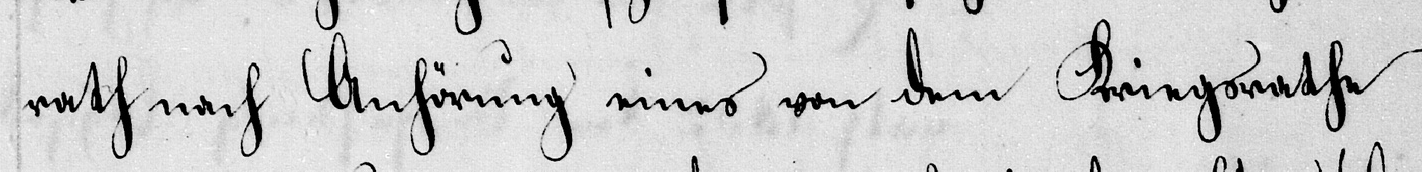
rath nach Anhörung eines von dem Kriegsrathe
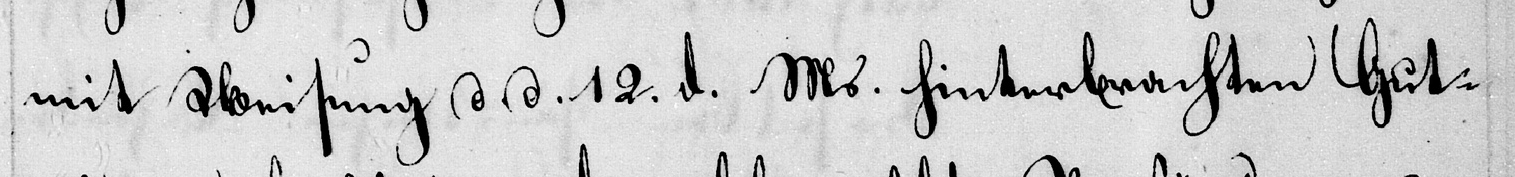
mit Weisung d. d. 12. d. Ms. hinterbrachten Gut¬
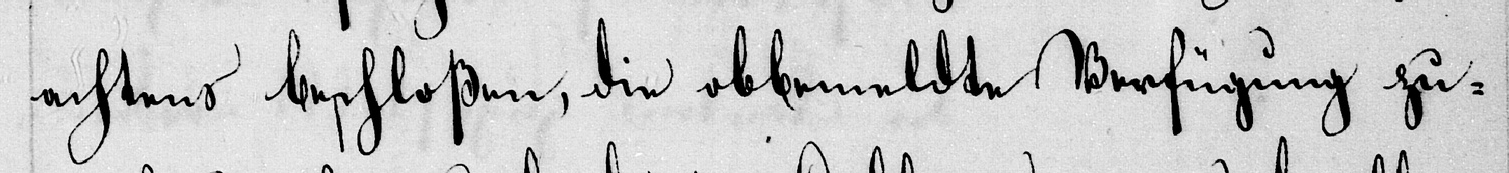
achtens beschloßen, die obbemeldte Verfügung zu¬
